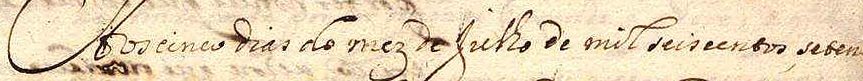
Aos cinco dias do mez de Julho de mil seiscentos, seten
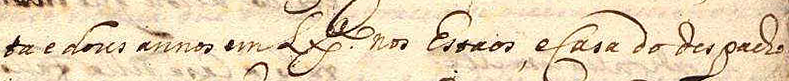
ta e dous annos em Lx.a nos Estaos, e Casa do despacho
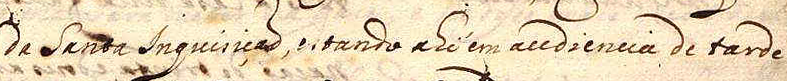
da Santa Inquisiçaõ, estando ahi em audiencia de tarde
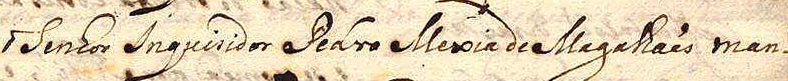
o Senhor Inquisidor Pedro Mexia de Magalhaẽs man
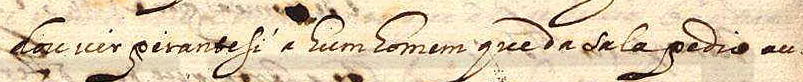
dou uir perante si a hum homem que da sala pedio au
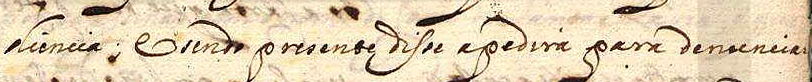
diencia; e sendo presente disse a pedira para denunciar
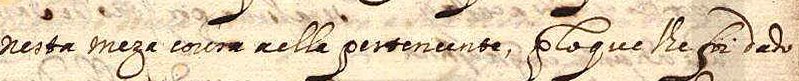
nesta meza cousa a ella pertencente, p̄lo que lhe foi dado
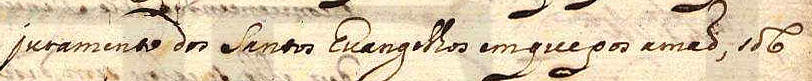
juramento dos Santos Euangelhos em que pos a maõ, sob
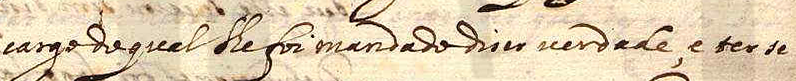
cargo do qual lhe foi mandado diser uerdade, e ter se
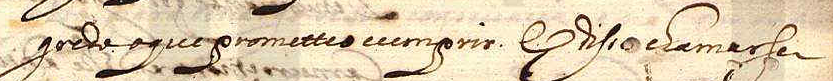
gredo o que prometteo cumprir. e diss_ chamarse
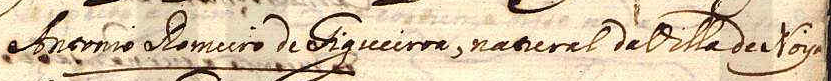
Antonio Romeiro de Figueiroa, natural da Villa de Noya
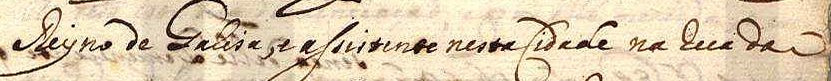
Reyno de Galisa, e assistente nesta Cidade na Rua da
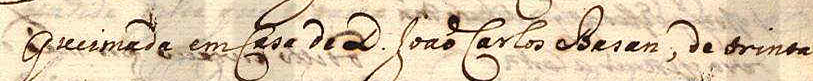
Queimada em Casa de D. Joaõ Carlos Basan, de trinta
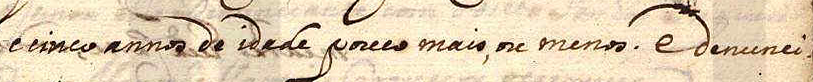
e cinco annos de idade pouco mais, ou menos. e denunci
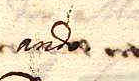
ando.
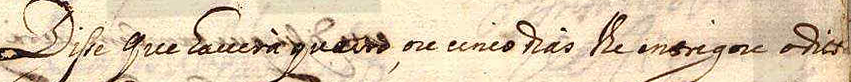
Disse que hauerà quatro, ou cinco dias lhe entregou o ditt
